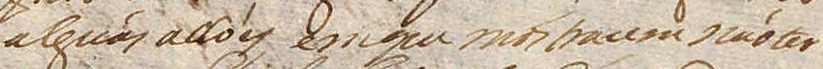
alguās acções, em que mostracem naõ ter
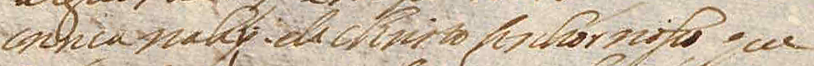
crença na ley de christo senhor nosso, que
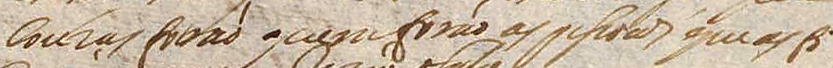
couzas foraõ quem foraõ as pesoas que as fi
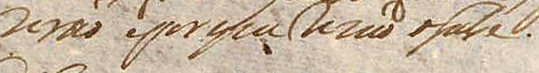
zerão e por que rezaõ o sabe.
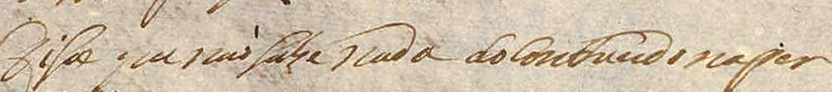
Disse que naõ sabe nada do contheudo na per
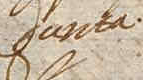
gunta.
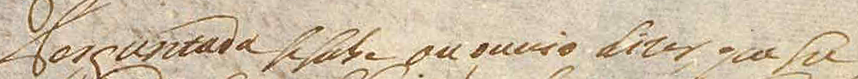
Perguntada se sabe ou ouuio dizer que he
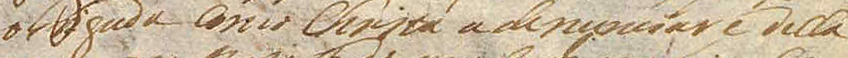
obrigada como Christã a denunciar e decla
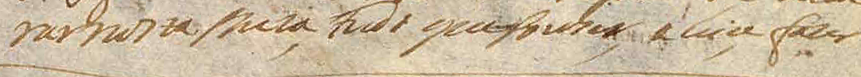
rar nesta Meza, tudo que souber, e uice fazer
